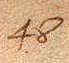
48
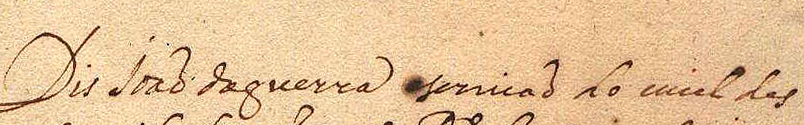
Dis Ioaõ da guerra escriuaõ do ciuel des
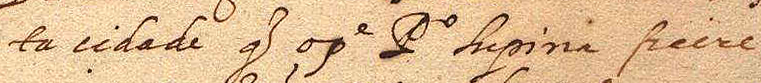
ta cidade q̄ o pe Po lupina freire
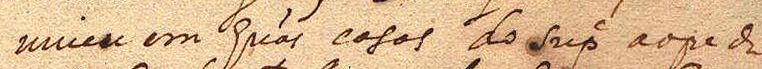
uiueu em huās casas do supe ao pe da
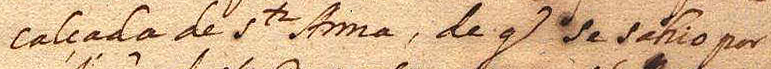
calçada de sta Anna, de q̄ se sahio por
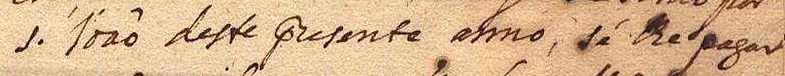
S. Ioão deste presente anno, só lhe pagar
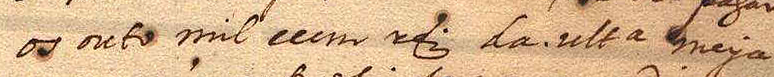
os outo mil e um rez̄ da ulta meya
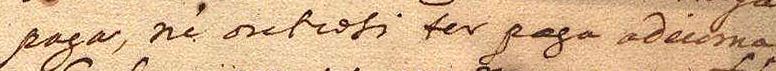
paga, nē outrosi ter paga a decima
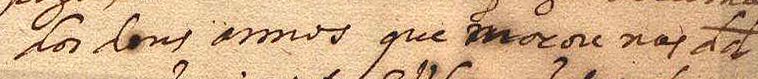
dos dous annos que morou nas d̄d̄
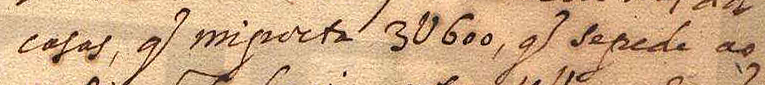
casas, q̄ importa 3$600, q̄ se pede ao
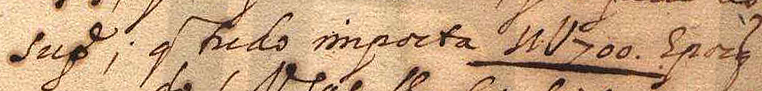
supe; q̄ tudo importa 11$700. E porq̄
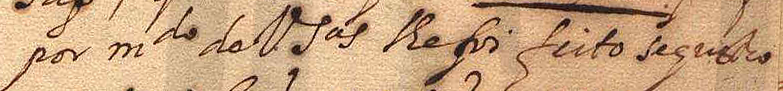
por mdo de V S.as lhe foi feito sequestro
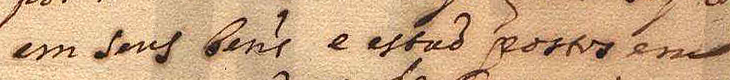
em seus bens e estaõ postos em
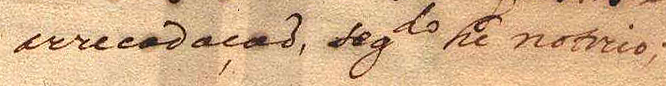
arrecadaçaõ, segdo he notorio;
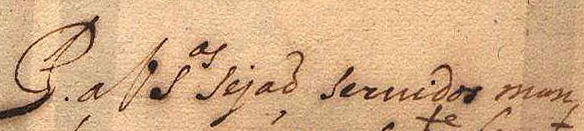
P. a V S.as sejaõ seruidos man
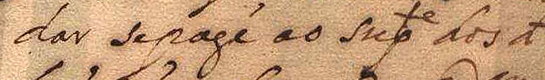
dar se pagē ao supte dos d̄
